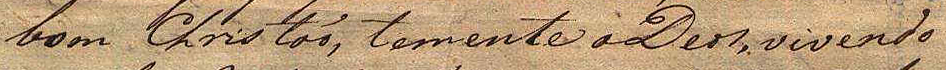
bom Christaõ, temente a Deos, vivendo
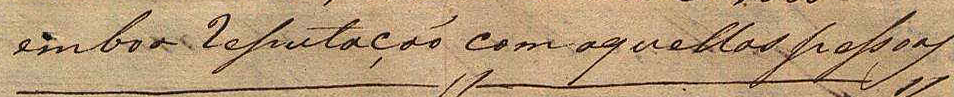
em boa Reputaçaõ com aquellas pessoas
